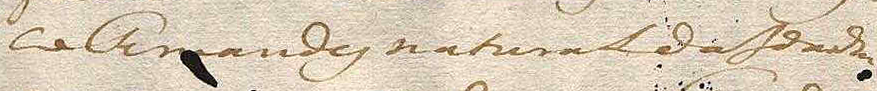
co Fernandes natural da Jdanha
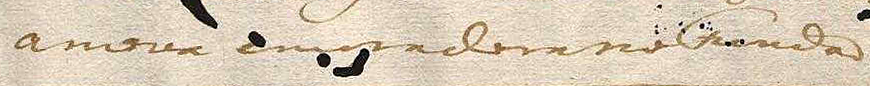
a nova e moradora no Fundaõ
